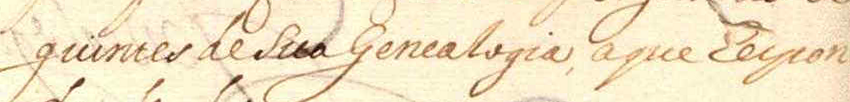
guintes de sua Genealogia, a que Respon
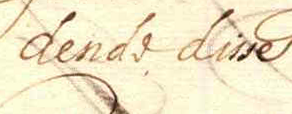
dendo disse
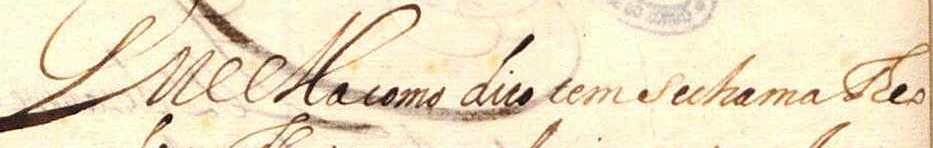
Que ella como dito tem se chama Theo
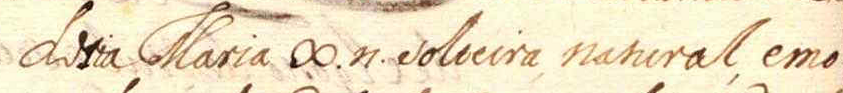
dosia Maria x. n. solteira natural e mo
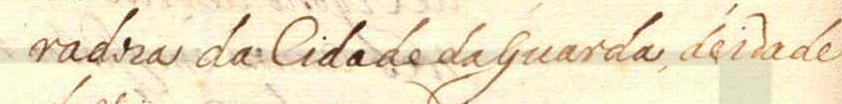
radora da Cidade da Guarda, de idade
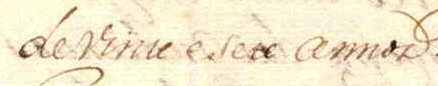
de vinte e sete annoz.
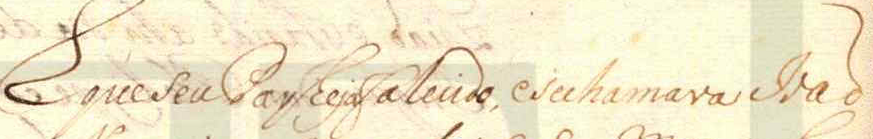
E que seu Pay he ja falecido, e se chamava Ioaõ
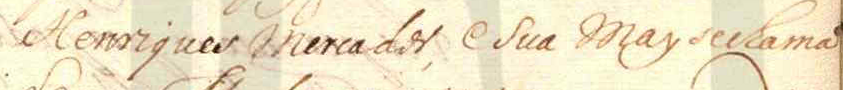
Henriques mercador, e sua may se chama
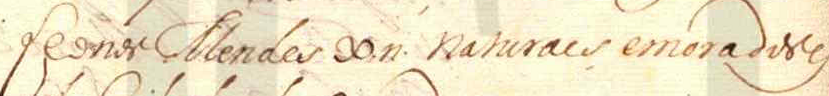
Leonor Mendes x n. naturaes, e moradores
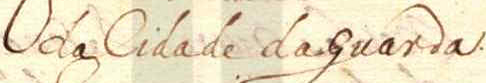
da Cidade da guarda.
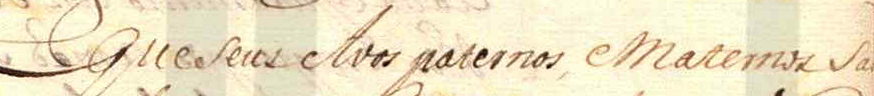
E que seus Avos paternos, e maternoz sa
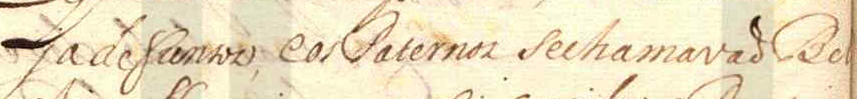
ja defuntoz, e os Paternoz se chamavaõ Bel
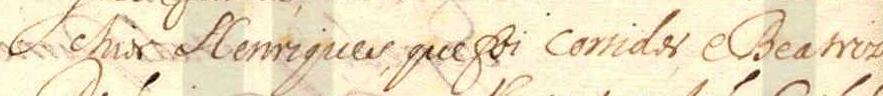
chior Henriques, que foi cortidor, e Beatriz
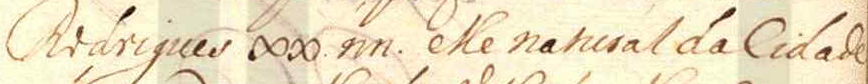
Rodrigues xx. nn. elle natural da Cidade
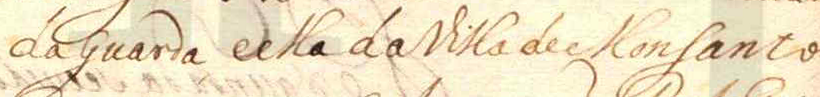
da Guarda, e ella da Villa de Monsanto
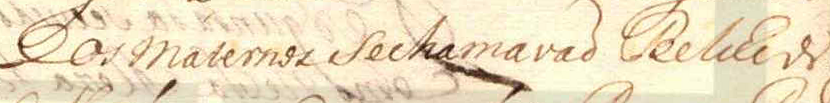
E os maternos se chamavaõ Belchior
